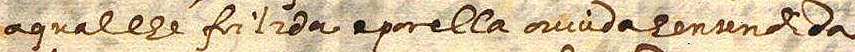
a qual lhe foi lida e por ella ouuida E entendida
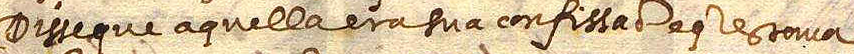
Disse que aquella era sua confissaõ e q̄ estaua
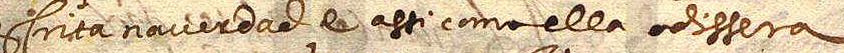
esCrita na uerdade assi como ella o dissera
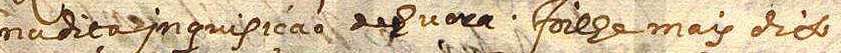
na dita jnquisiçaõ de Euora. Foilhe mais dito
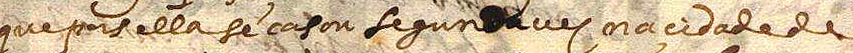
que pois ella se casou segunda ues na çidade de
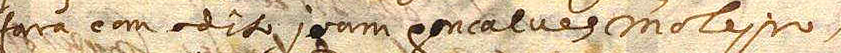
faro com o dito joam goncalues molejro,
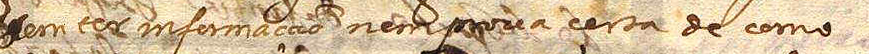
sem ter informaçaõ nem proua çerta de como
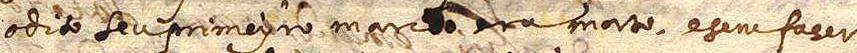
o dito seu primeyro marido era morto. e sem fazer
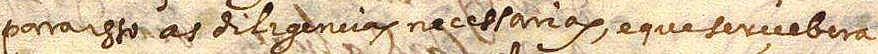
para isso as diligencias necessarias, e que se reçebera
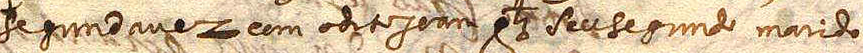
segunda uez com o dito joam gl̄z seu segundo marido
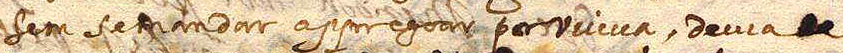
sem se mandar appregoar por viuua, deuia _e
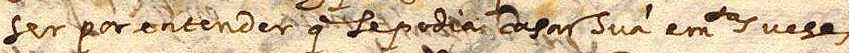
ser por entender q̄ se podia casar huā e mtas uezes
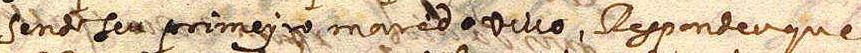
sendo seu primeyro marido viuo, Respondeo que
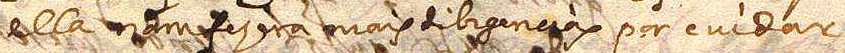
ella nam fezera mais diligencias por cuidar
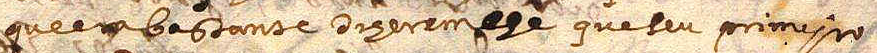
que era bastante dizeremlhe que seu primejro
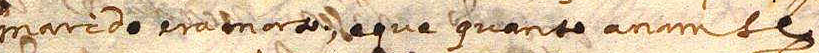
marido era morto; e que quanto a nam se
